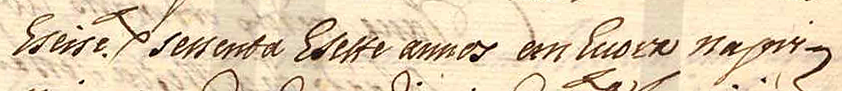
E seisc.tos sessenta E sette annos em Euora na pri
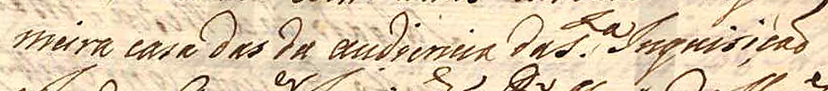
meira casa das da audiencia da s.ta Inquisição
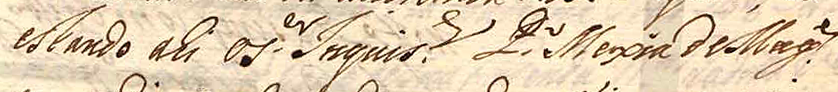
estando ahi o s.or Inquis.or P.o Mexia de Mag.es
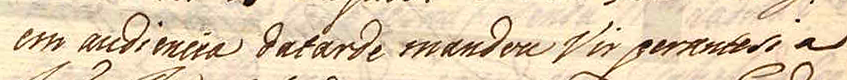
em audiencia da tarde mandou Vir perante si a
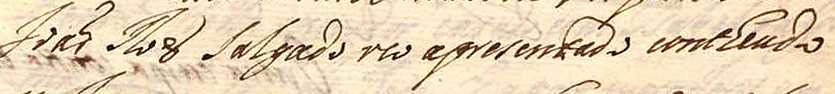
Joaõ Roes̄ Salgado reo apresentado contheudo
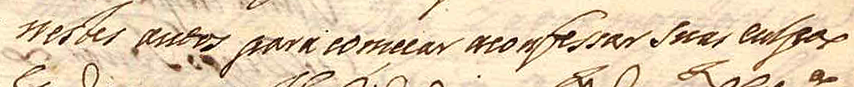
nestes autos para começar a confessar suas culpas
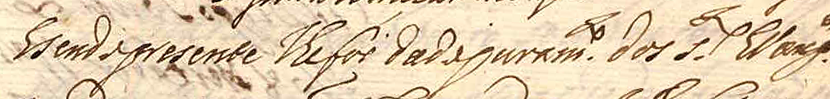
E sendo presente lhe foi dado juram.to dos s.tos Evang.os
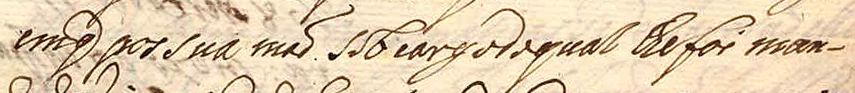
em q̄ pos sua maõ sob cargo do qual lhe foi man
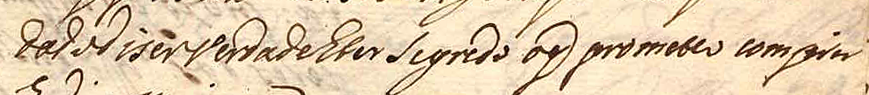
dado diser verdade E ter segredo o q̄ prometeo comprir
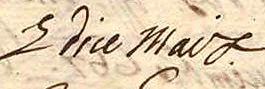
E dice mais
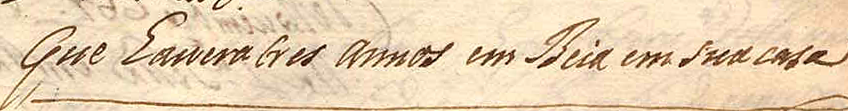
Que hauera tres annos em Beia em sua casa
